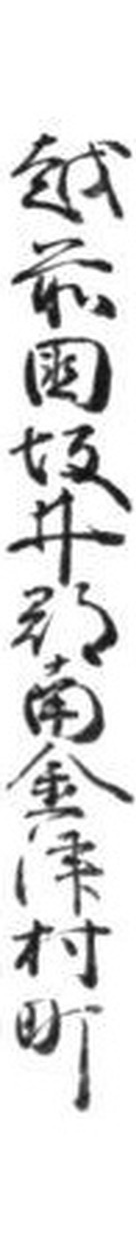越前国坂井郡南金津村町
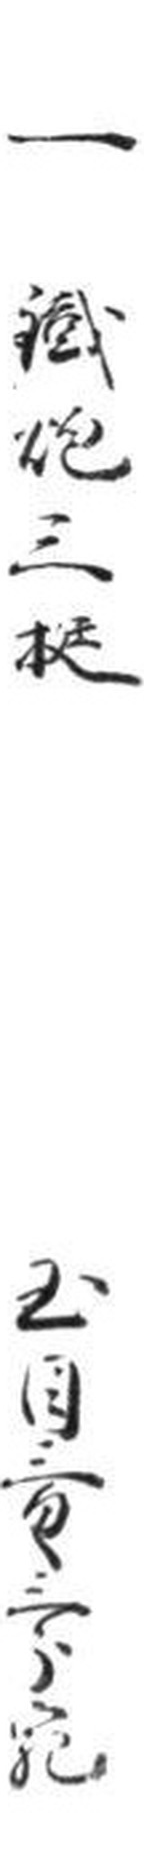一鉄炮三挺玉目三匁三分宛
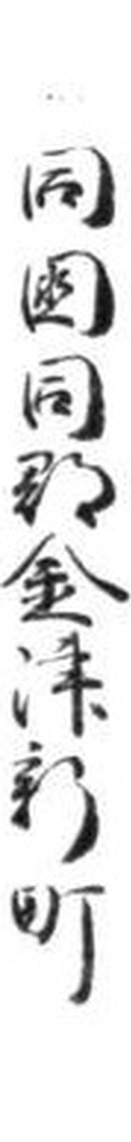同国同郡金津新町
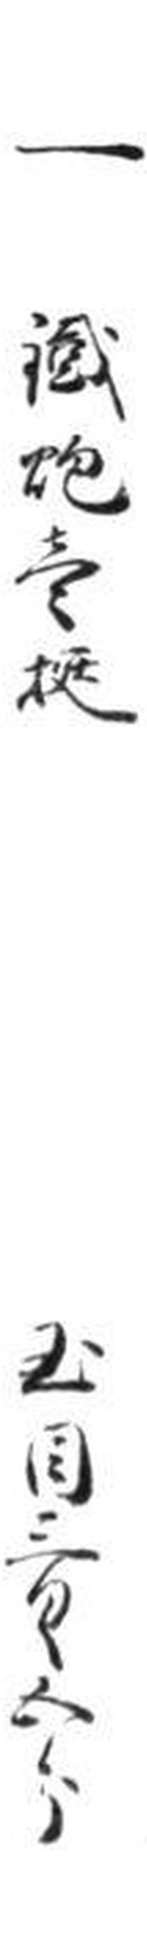一鉄炮壱挺玉目三匁五分
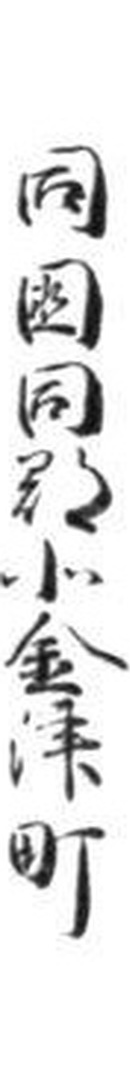同国同郡北金津町
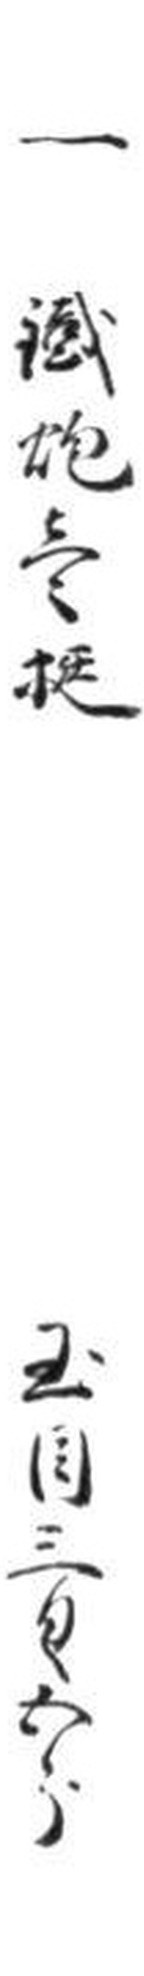一鉄炮壱挺玉目三匁五分
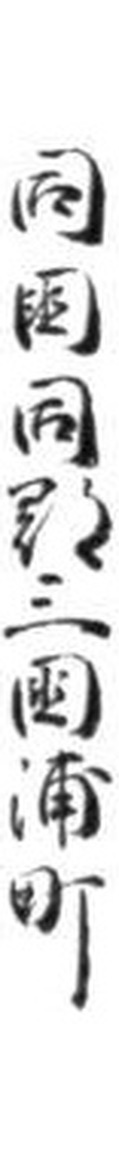同国同郡三国浦町
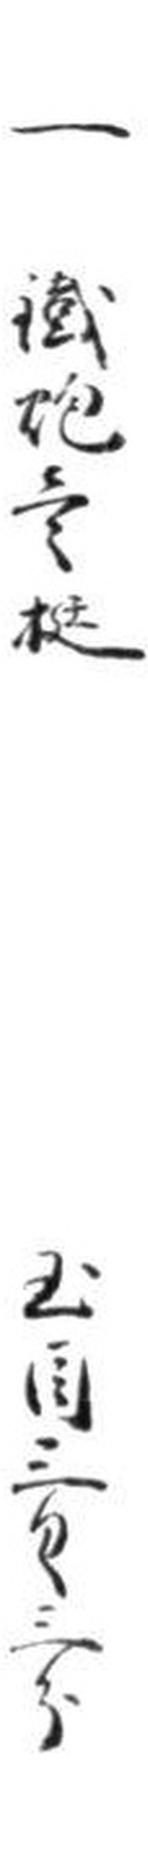一鉄炮壱挺玉目三匁三分
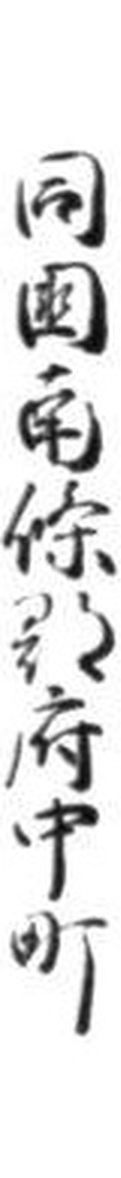同国南條郡府中町
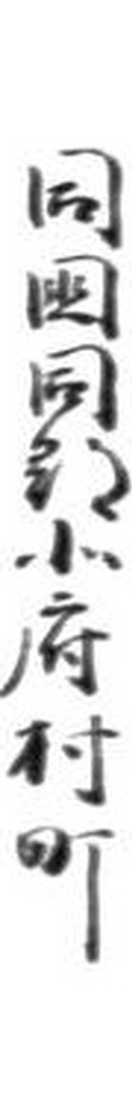同国同郡北府村町

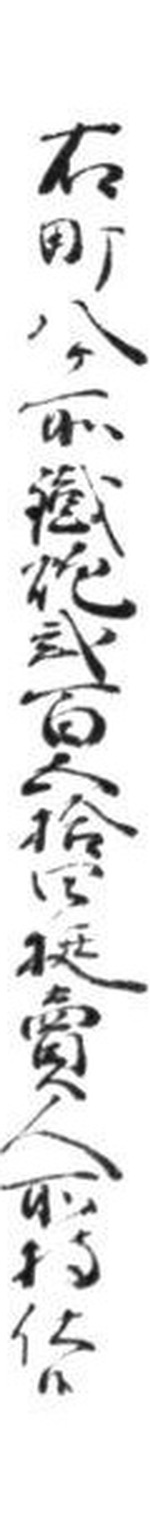右町八ヶ所鉄炮弐百五拾四挺売人所持仕候
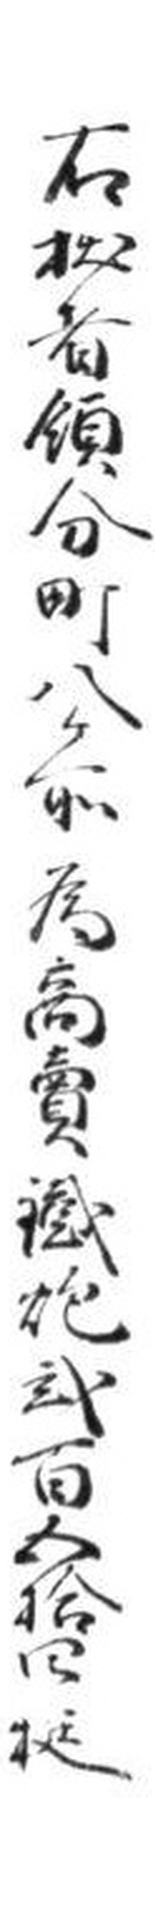右状者領分町八ヶ所為商売鉄炮弐百五拾四挺
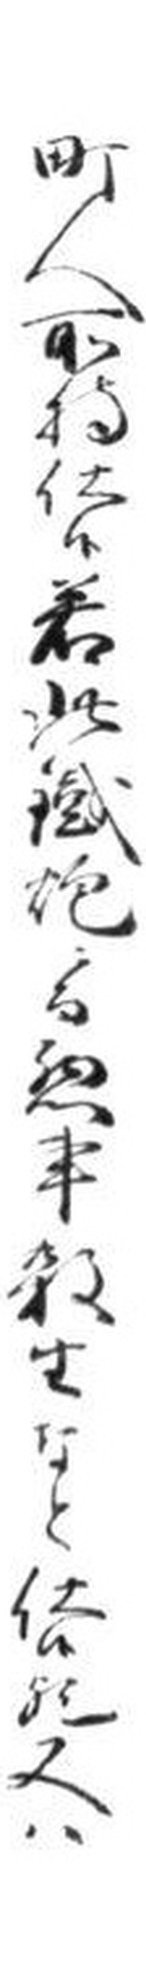町人所持仕候若此鉄炮ニ而悪事殺生なと仕候歟又ハ
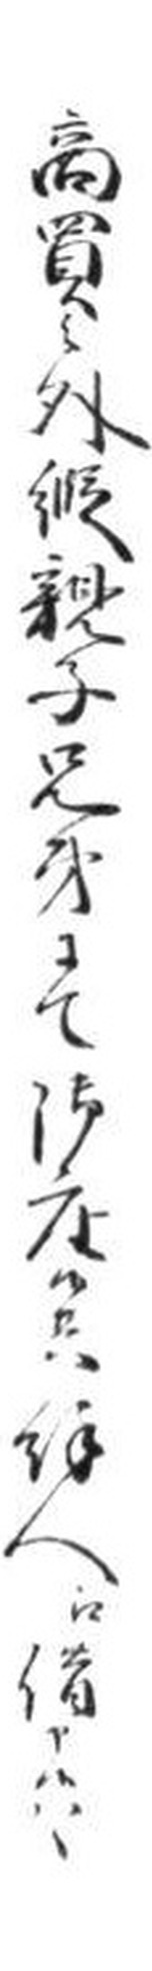商買之外縦親子兄弟にて御座候共余人江借申候ハヽ
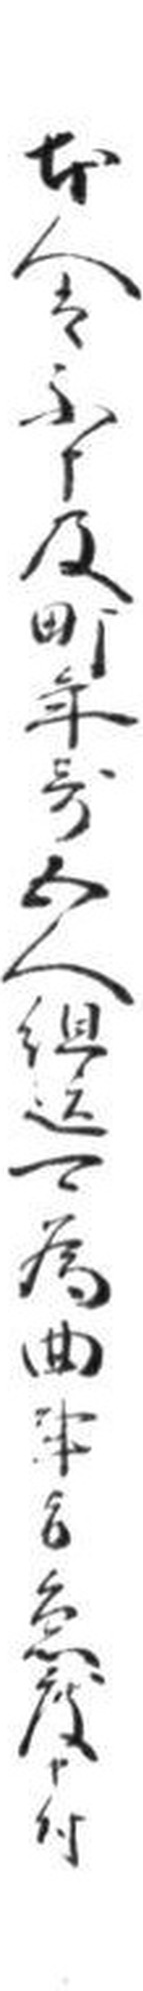本人は不申及町年寄五人組迄可為曲事旨急度申付
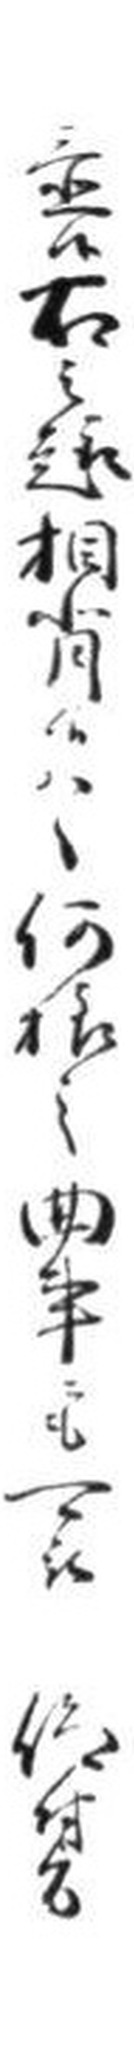置候右之趣相背候ハヽ何様之曲事ニも可被仰付旨
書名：家譜 十七 吉品公 従元禄元年到同二年
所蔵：福井県文書館 Fukui Prefectural Archives
